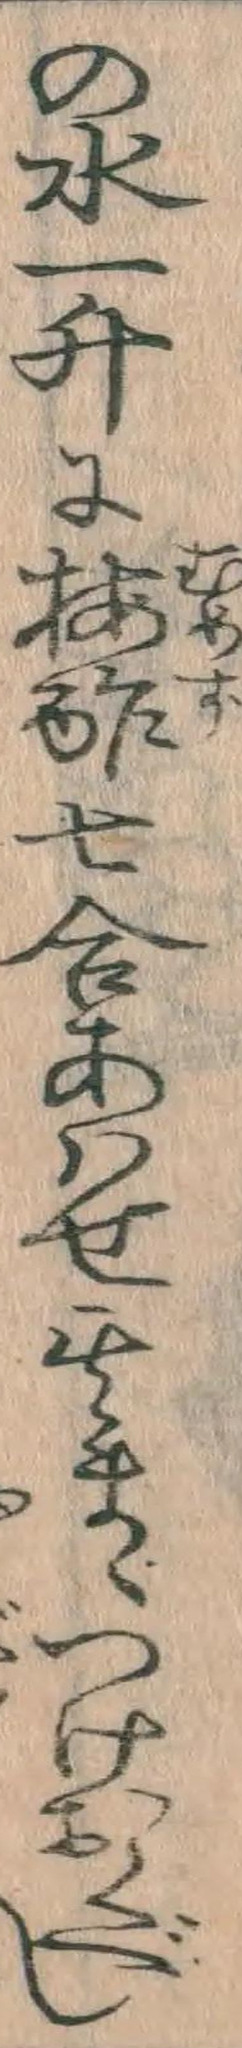の水一升に梅酢七合あはせ其まゝつけおくべし
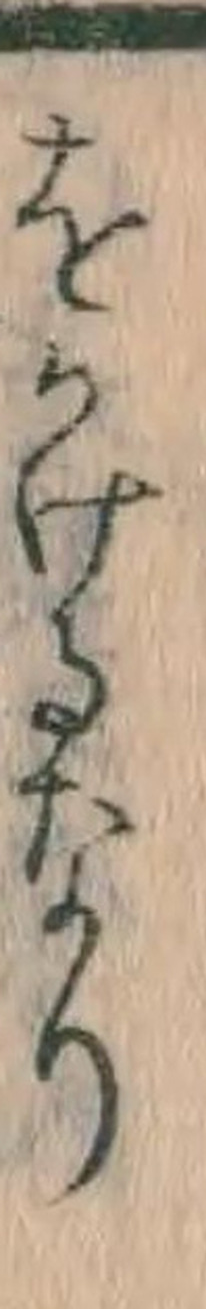をかけるなり
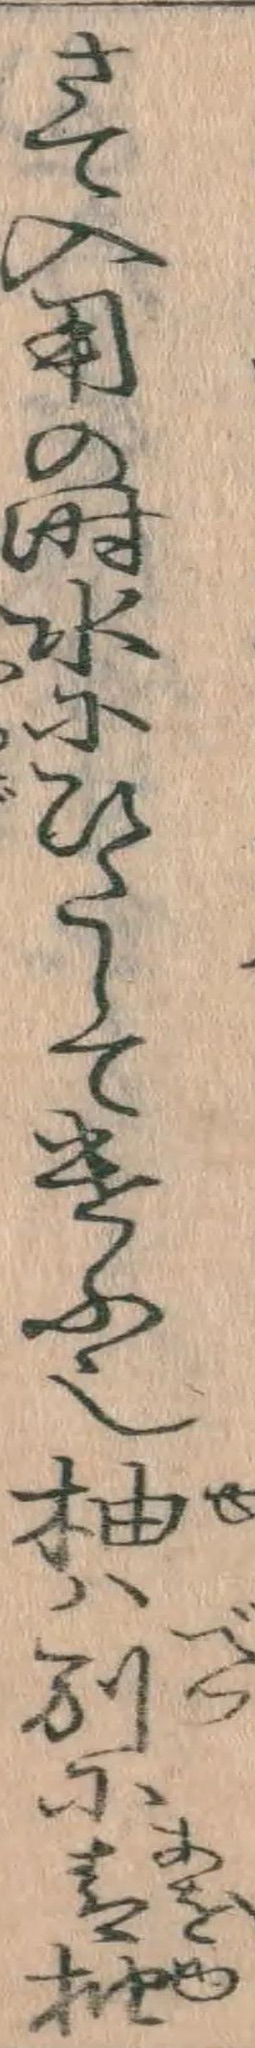さて入用の時水にひたして遣ふ也柚は別に青柚
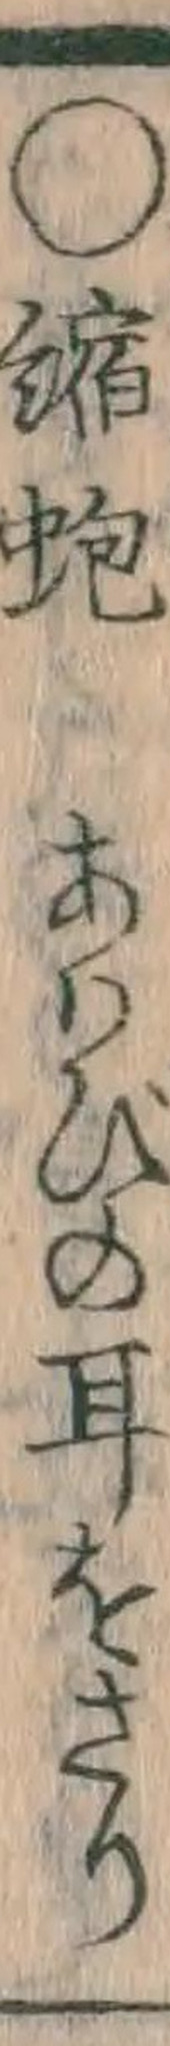○縮蚫あはびの耳をさり
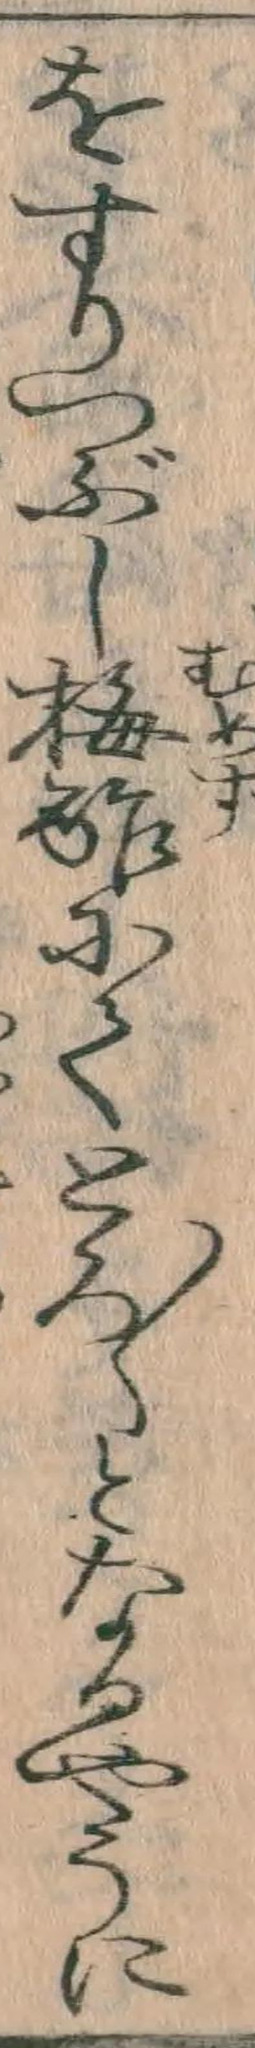をすりつぶし梅酢にてとろ〳〵となるやうに
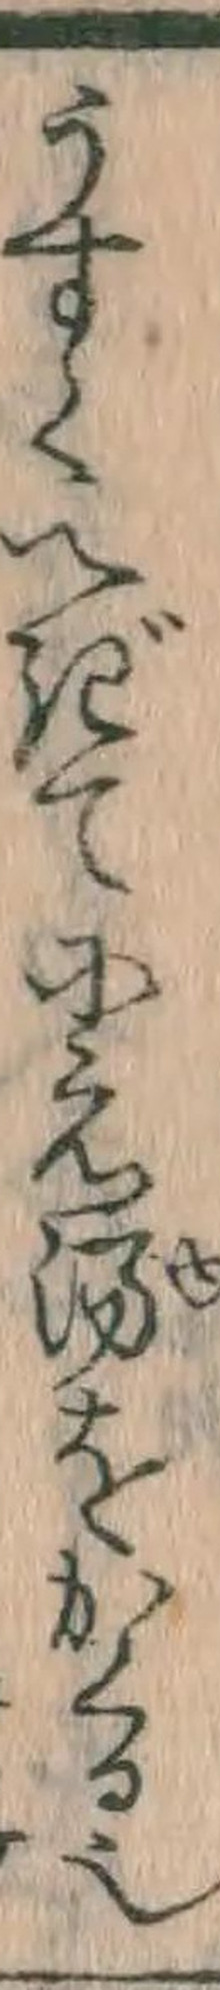うすくへぎてにえ湯をかくる也
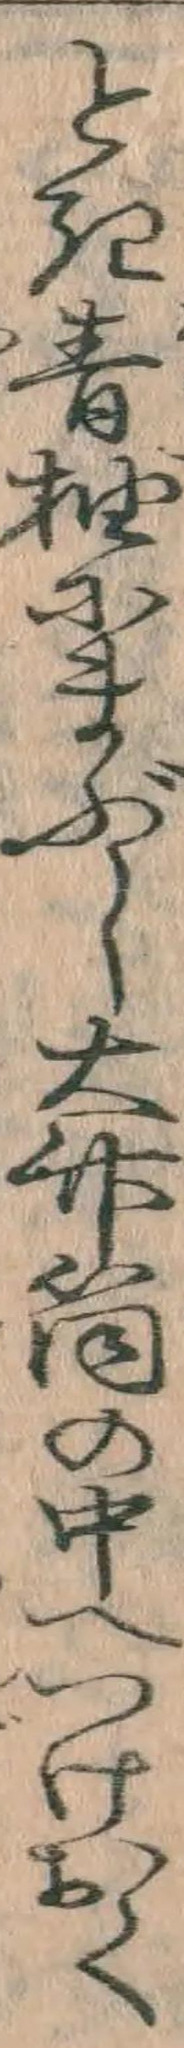とき青柚にまぶし大竹筒の中へつけおく
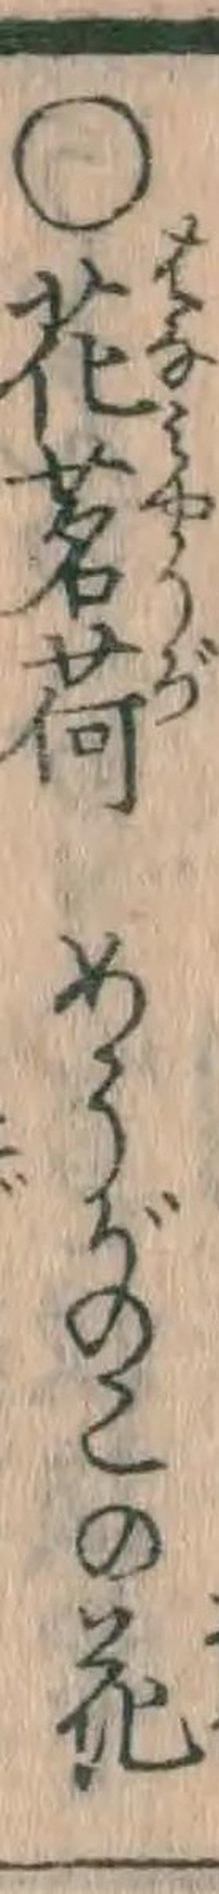○花茗荷めうがのこの花
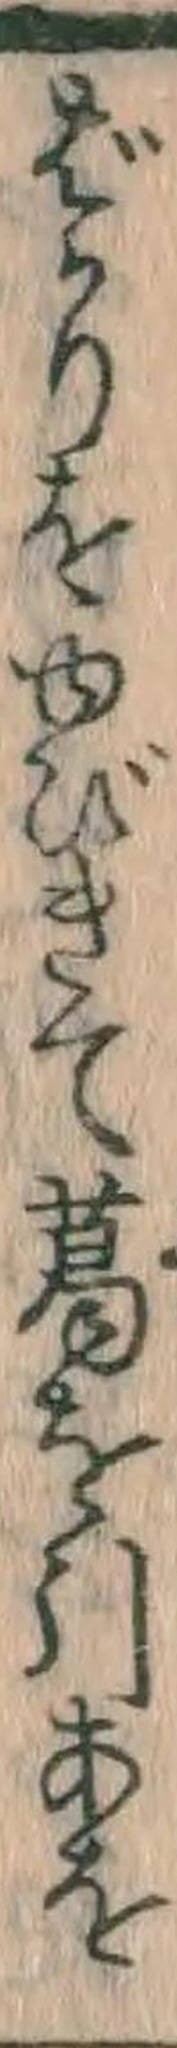ばかりをゆびきて葛を引あを
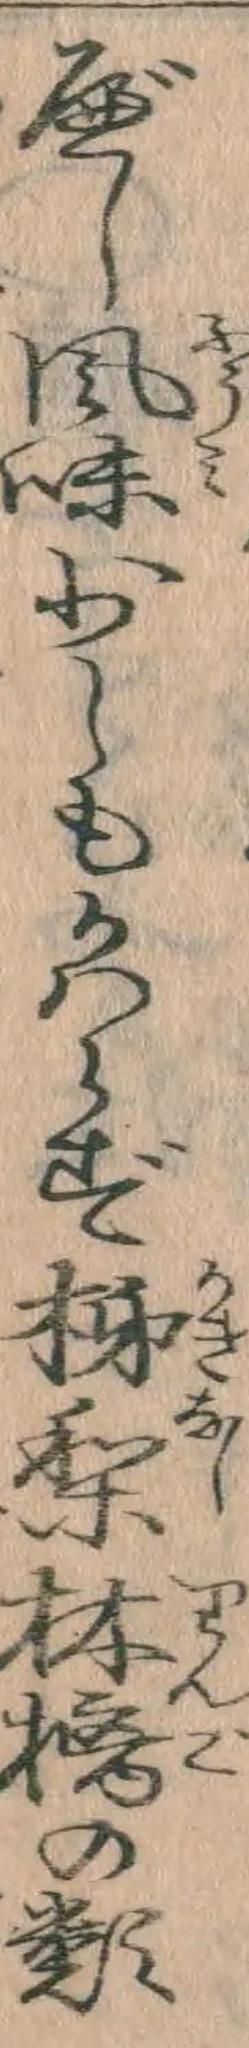べし風味少しもかはらず柿梨林檎の類
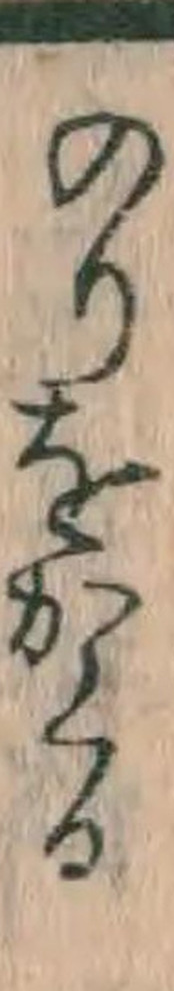のりをかくる
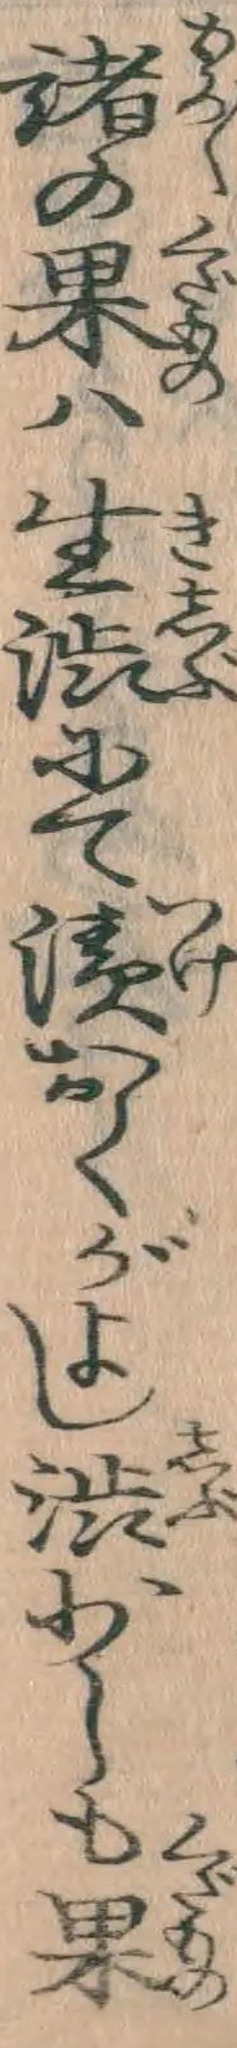諸の果は生渋にて漬おくがよし渋少しも果
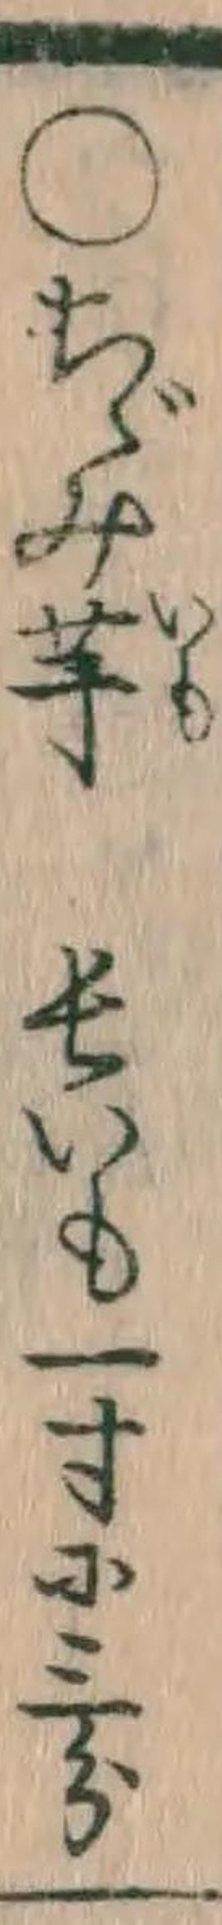○ちゞみ芋長いも一寸に三分
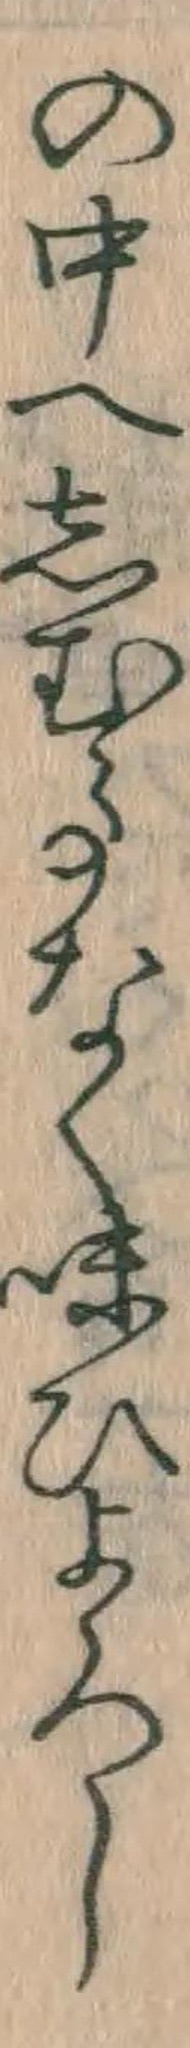の中へしむ事なく味ひよろし
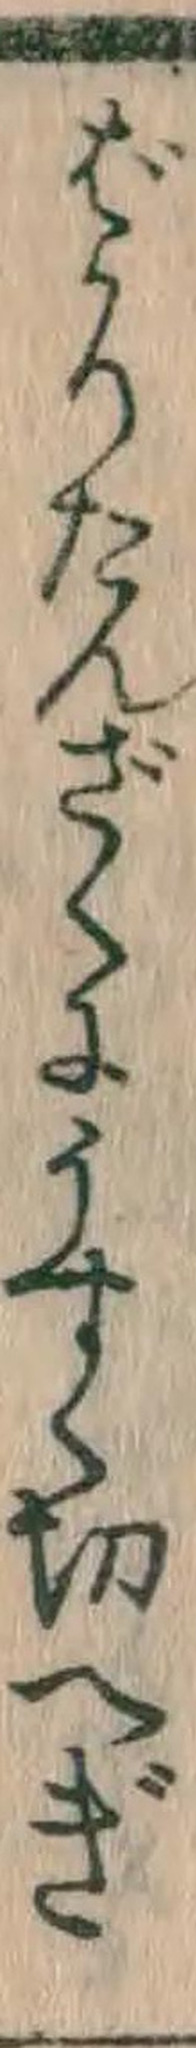ばかりたんざくにうすく切へぎ
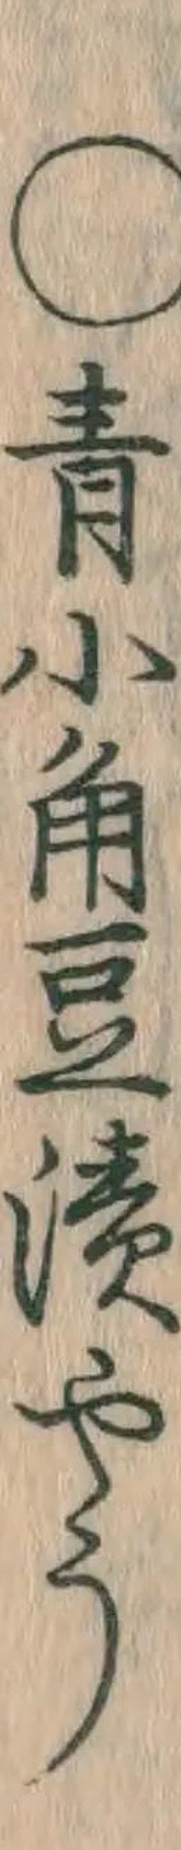○青小角豆漬やう
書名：広益秘事大全 3巻. [5]
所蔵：国立国会図書館 National Diet Library, JAPAN
